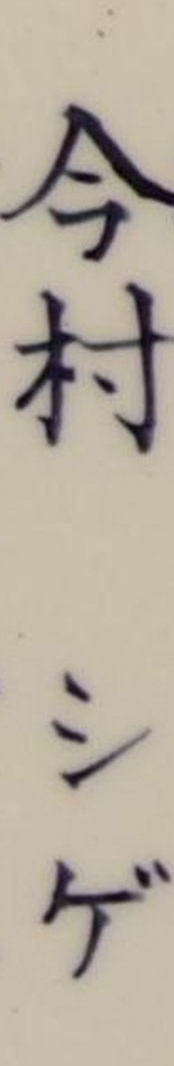今村シゲ
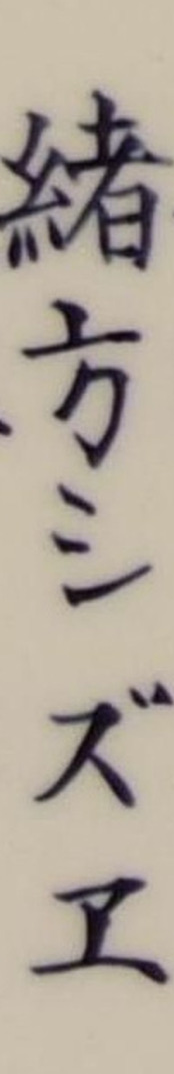緒方シズヱ

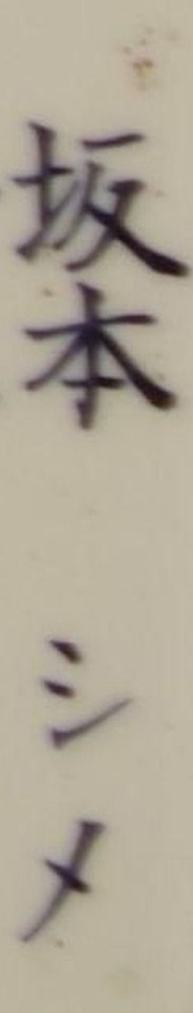坂本シメ
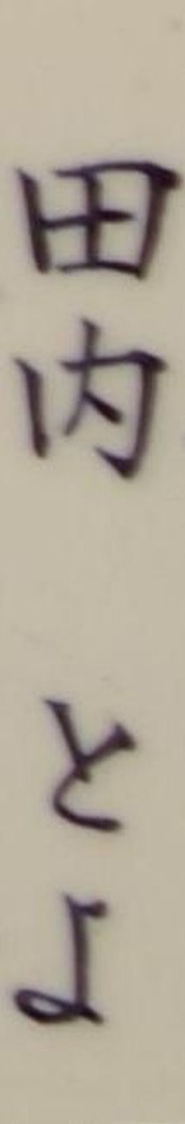田内とよ
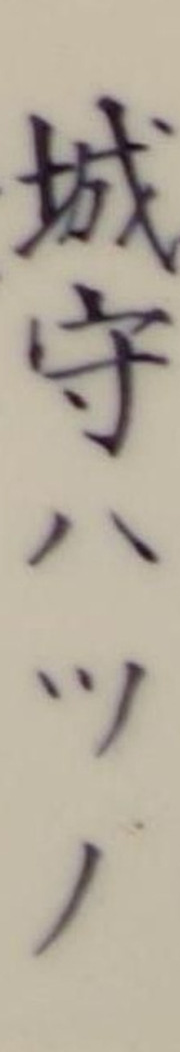城守ハツノ
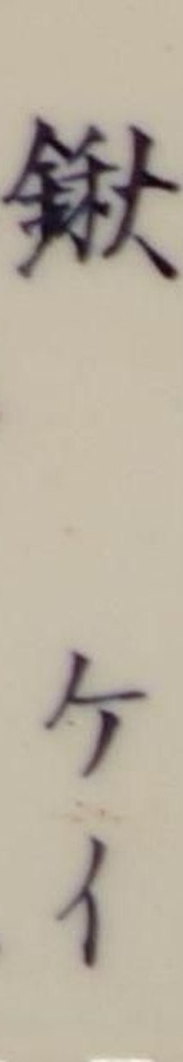鍬ケイ
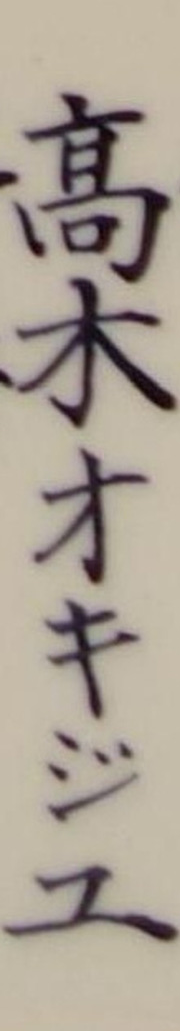高木オキジユ
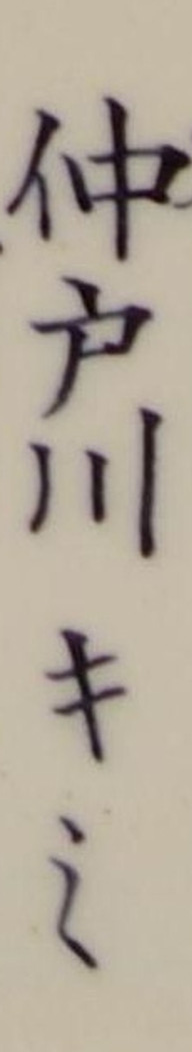仲戸川キ之
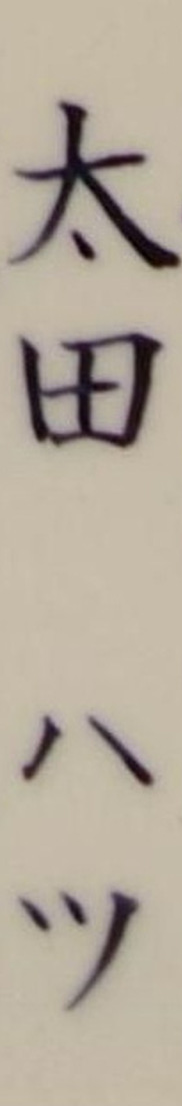太田ハツ
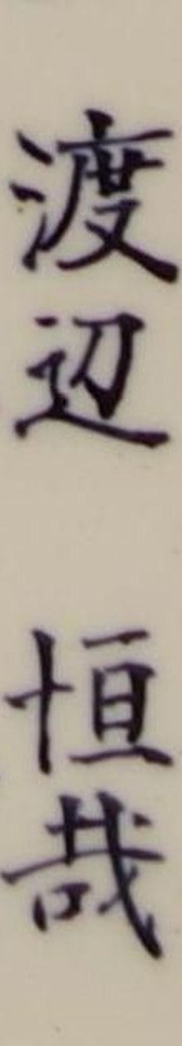渡辺恒哉
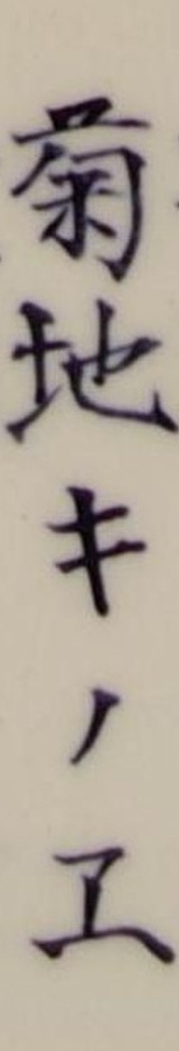菊地キノヱ
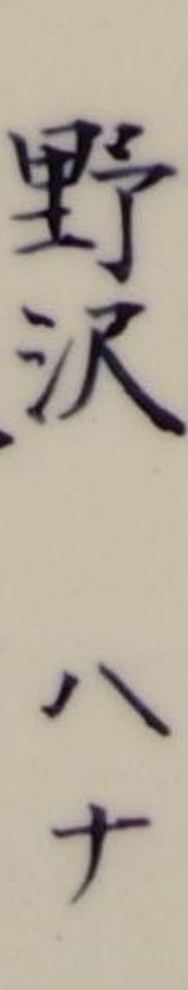野沢八ナ
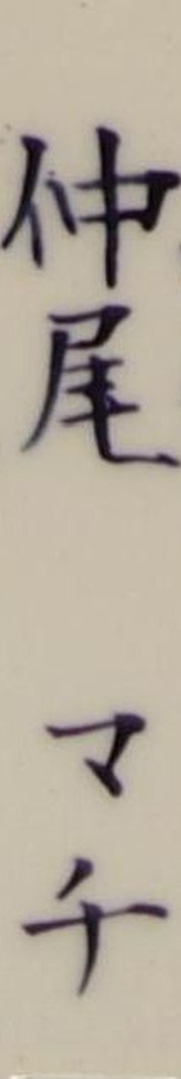仲尾マチ
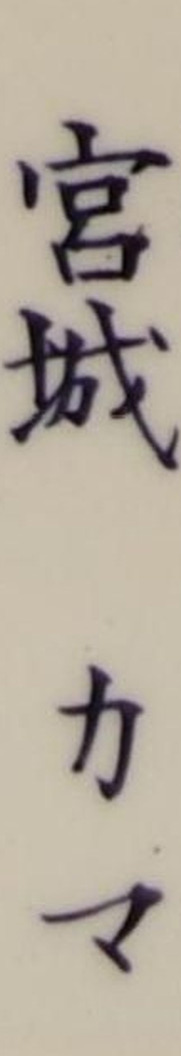宮城カマ
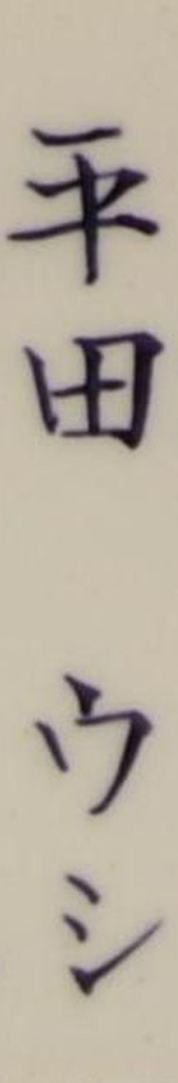平田ウシ
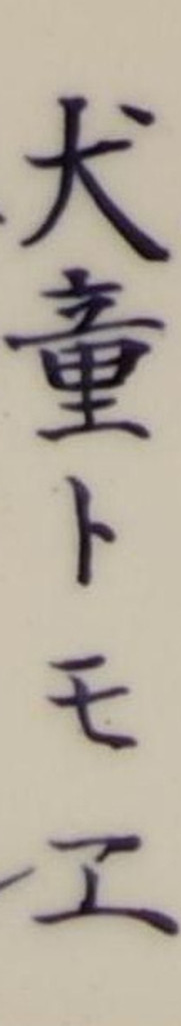犬童トモエ
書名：E~L
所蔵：高野山金剛峯寺
